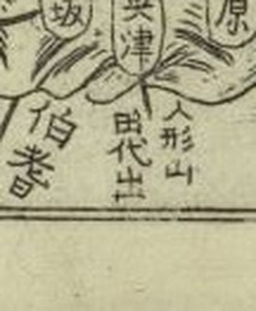田代出
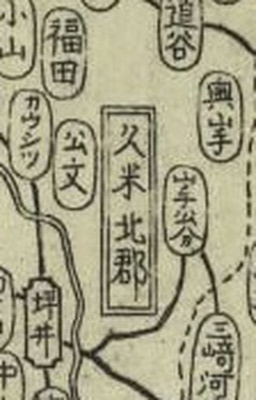久米北郡
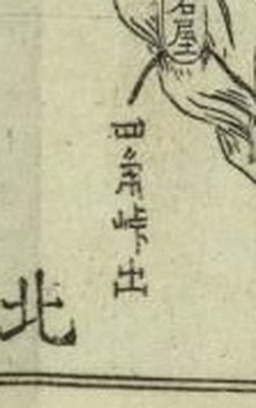四角峠出
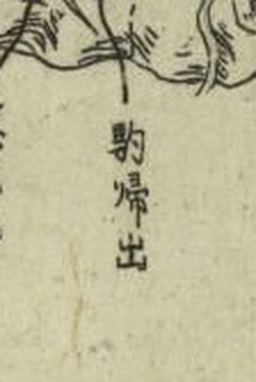駒帰出
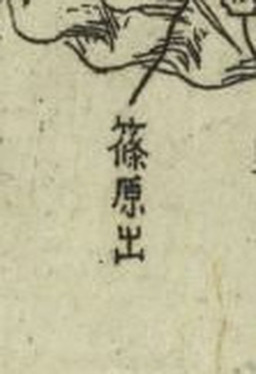篠原出
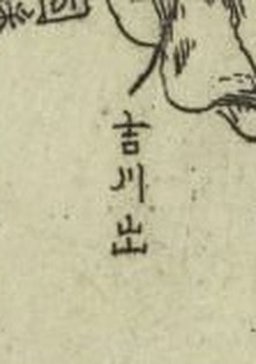吉川出

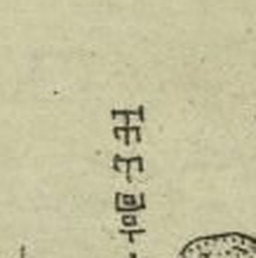高山出
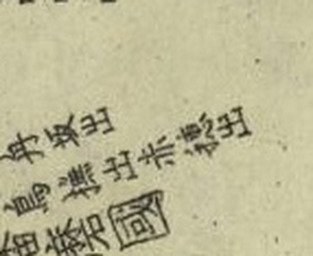鳥撫出赤穂出
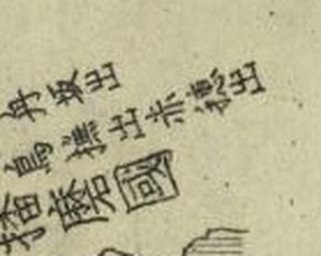鳥撫出赤穂出
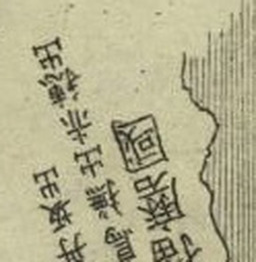播磨國
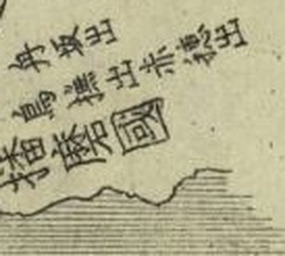播磨國
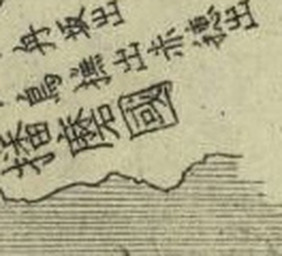播磨國
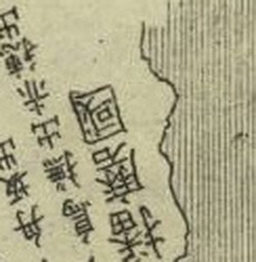播磨國
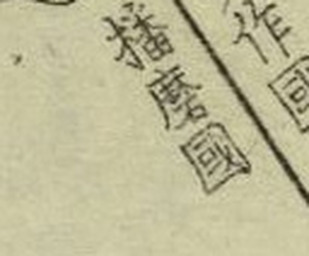播磨國
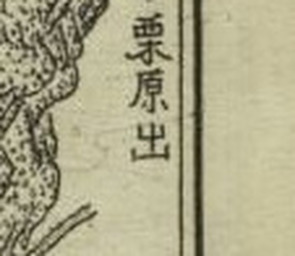栗原出

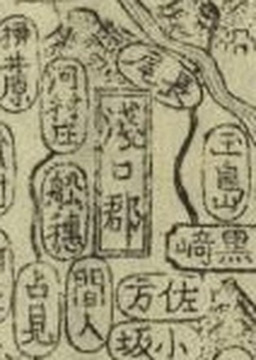淺口郡
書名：大日本国細図 西国之部 下
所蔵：University of the Ryukyus Library
